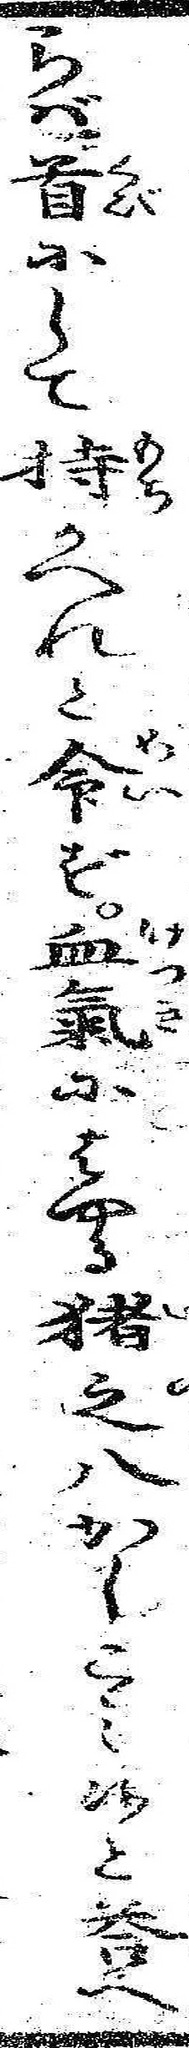らば首にして持かへれと命ず。血気にはやる猪之八かしこみ候と答へ。
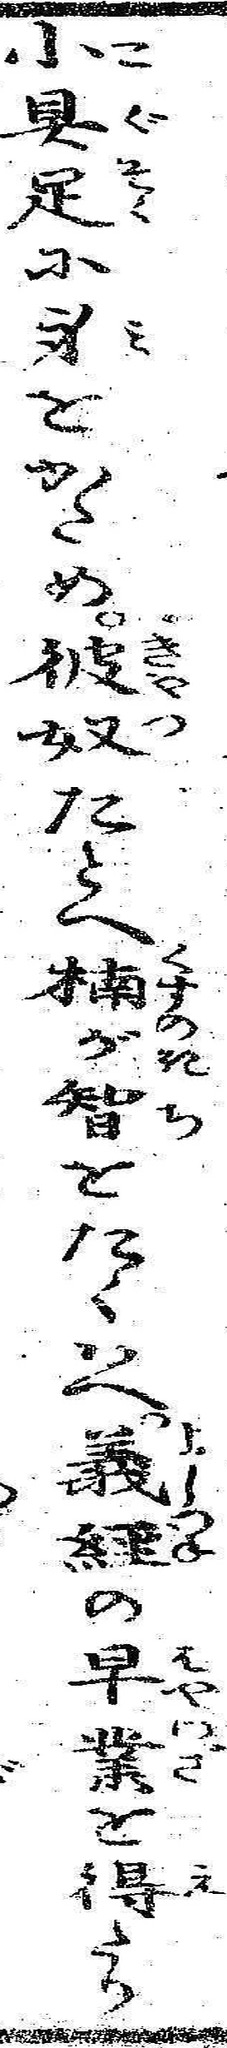小具足に身をかため。彼奴たとへ楠が智をたくはへ。義経の早業を得たり
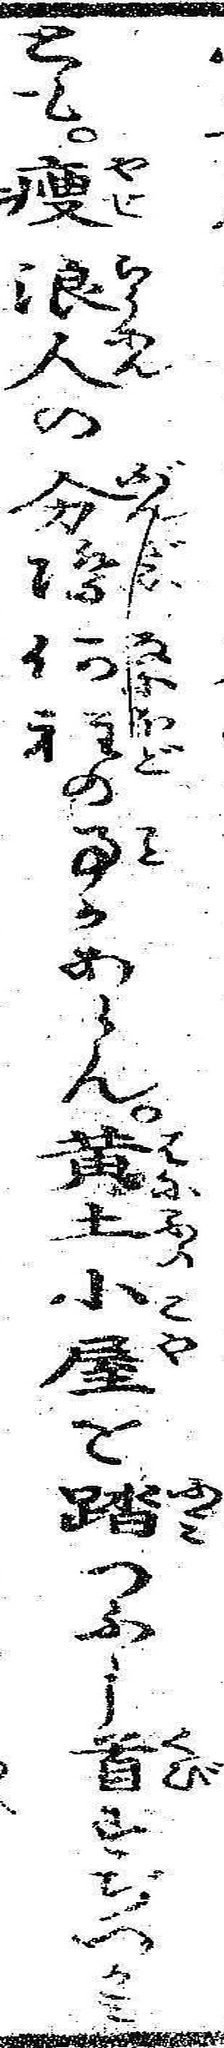とも。痩浪人の分際何程の事かあらん。黄土小屋を踏つふし首すぢつかみ
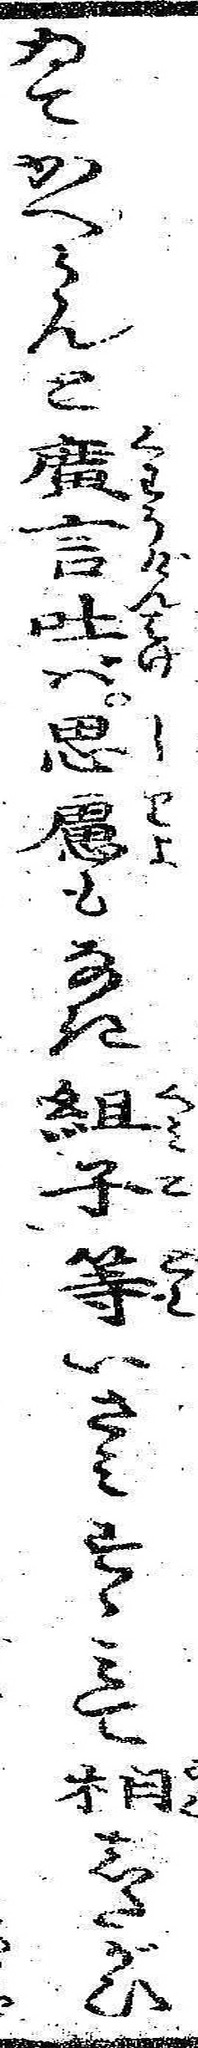ゐてかへらんと広言吐ば。思慮もなき組子等いさみすゝみて相したがひ
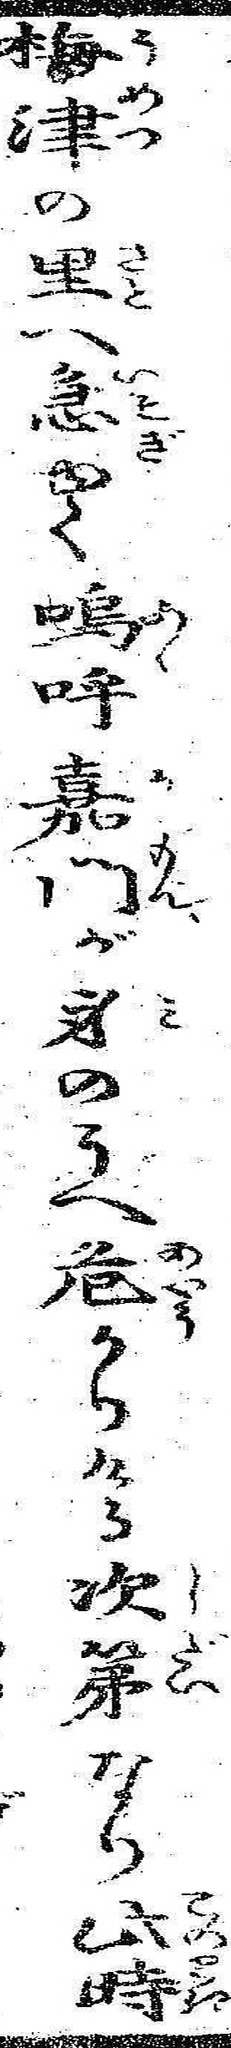梅津の里へ急ゆく嗚呼嘉門が身のうへ危かりける次第なり此時
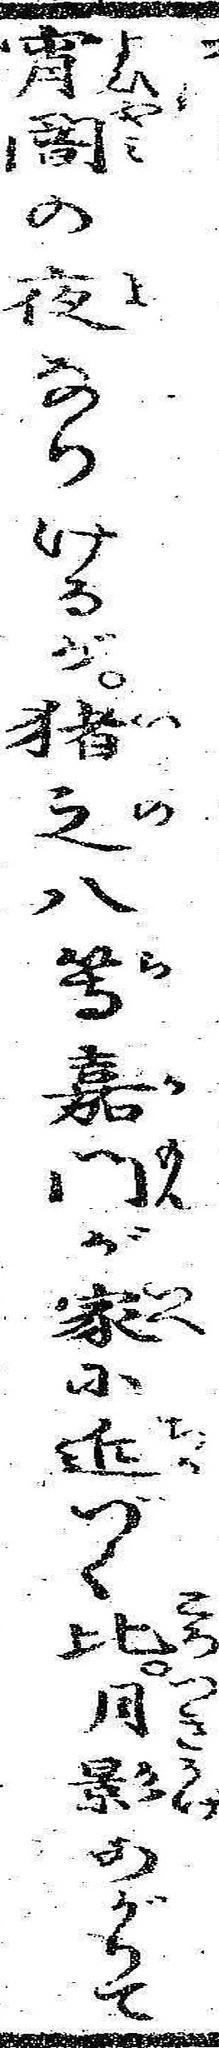宵闇の夜なりけるが。猪之八等嘉門が家に近づく比。月影あがりて
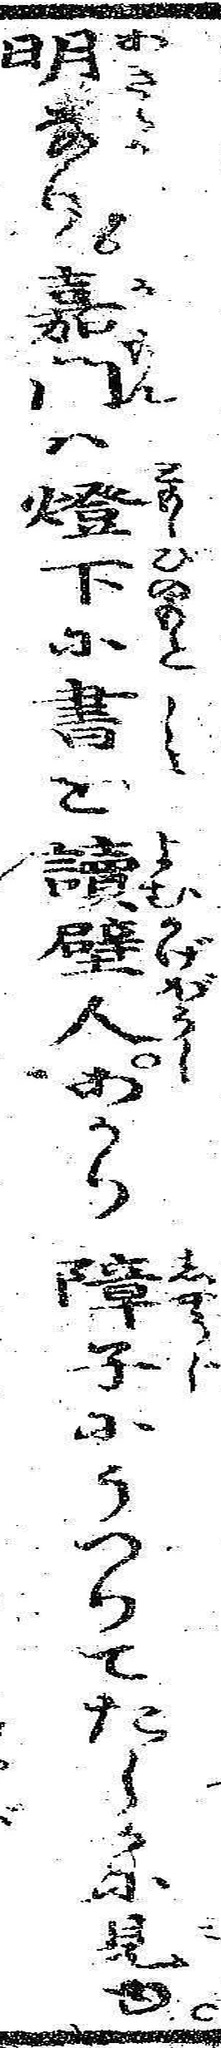明なり。嘉門は灯下に書を読壁人。あかり障子にうつりてたしかに見ゆ。
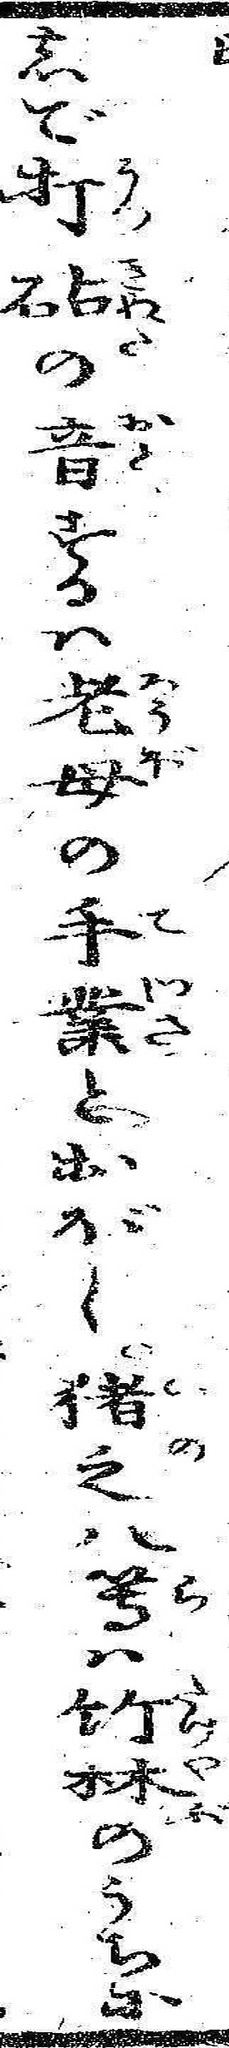しで打砧の音するは老母の手業とおぼし。猪之八等は竹林のうちに
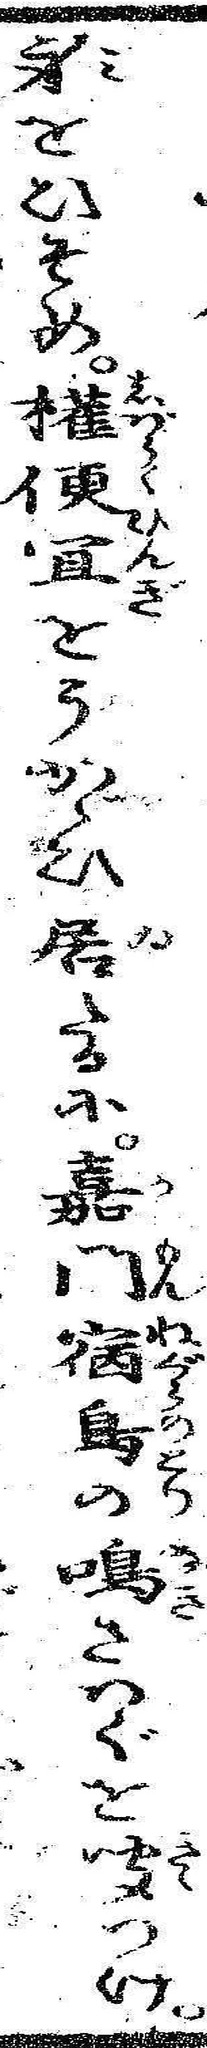身をひそめ。権便宜をうかゞひ居たるに。嘉門宿鳥の鳴さはぐを聞つけ。
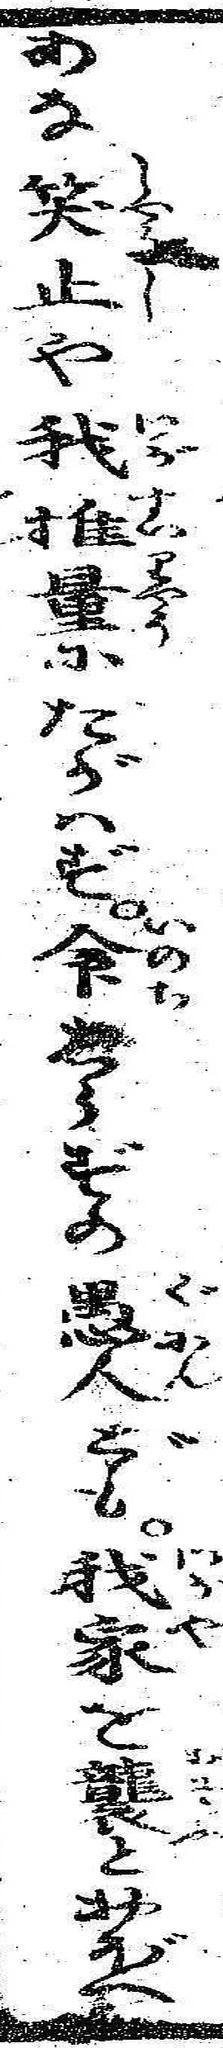あな笑止や我推量にたがはず。命しらずの愚人ども。我家を襲とおぼへ
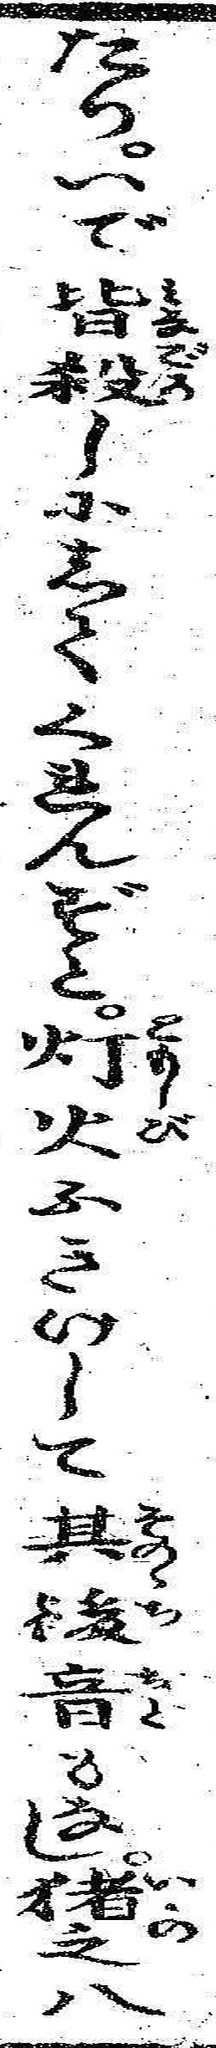たり。いで皆殺しにしてくれんぞと。灯火ふきけして其後音もなし。猪之八
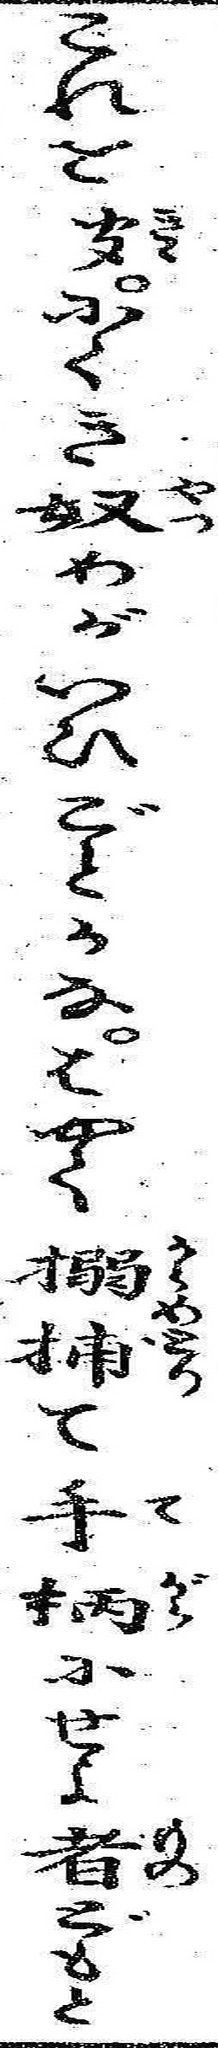これを聞。にくき奴めがいひごとかな。はやく搦捕て手柄にせよ者どもと
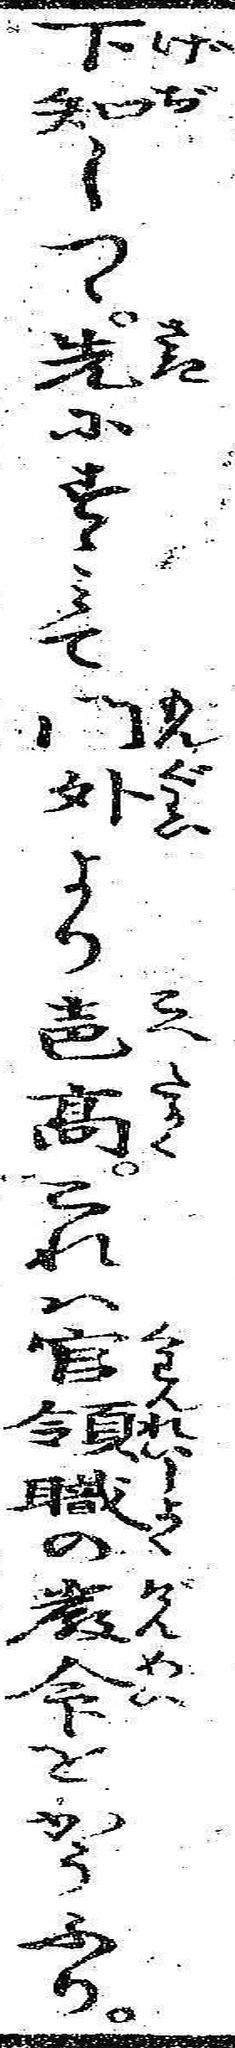下知しつゝ。先にすゝみて門外より声高。これは官領職の厳命をかうふり。
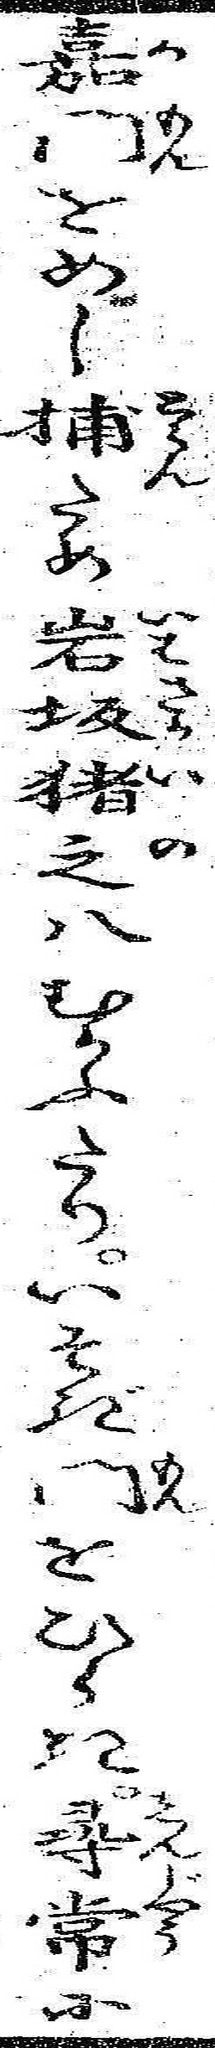嘉門をめし捕ため岩坂猪之八むかふたり。いそぎ門をひらき。尋常に
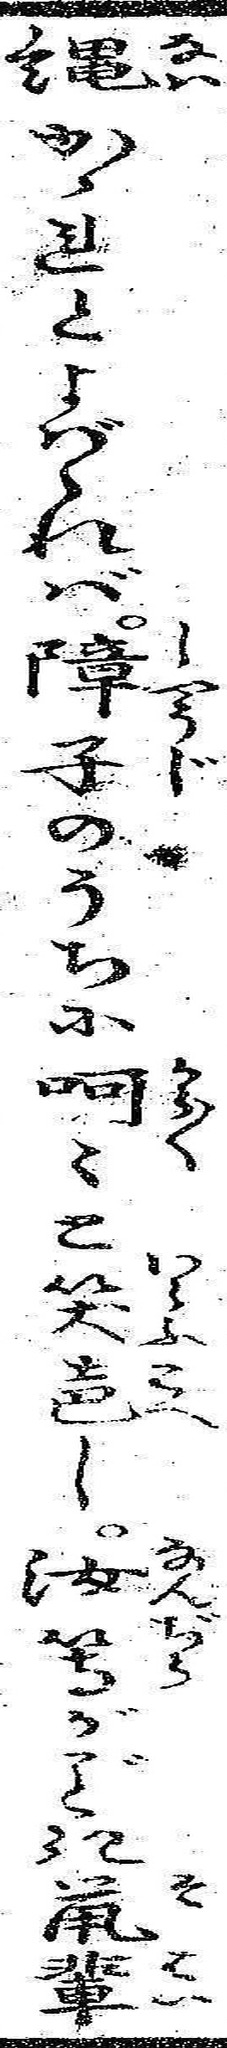縄かゝれとよばゝれば。障子のうちに呵々と笑声し。汝等がごとき鼠輩
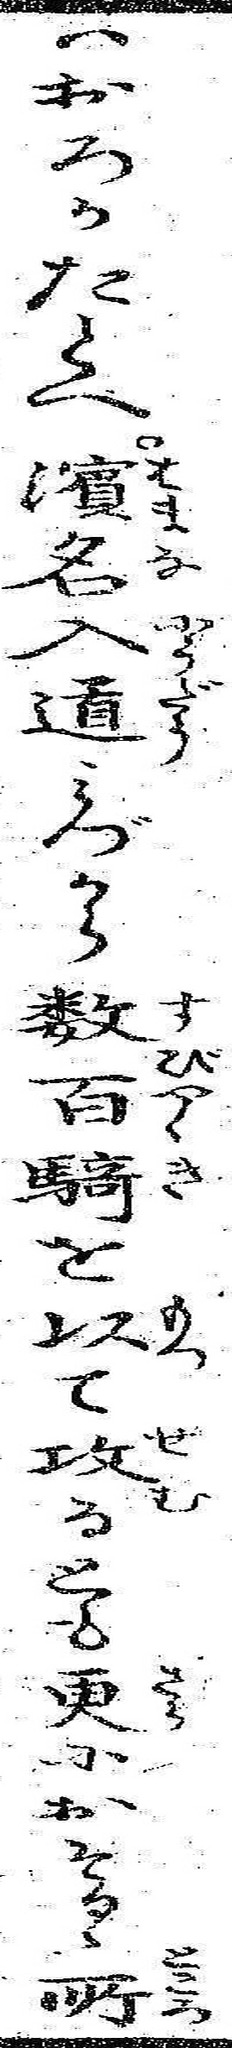はおろかたとへ。浜名入道みづから数百騎を以て攻るとも更におそるゝ所
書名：昔話稲妻表紙
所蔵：国文学研究資料館
